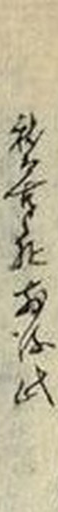稽古被遊前後此
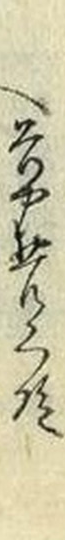谷中惣左衛門殿
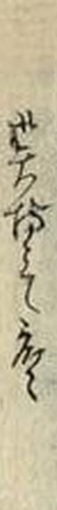御矢場ニて度々
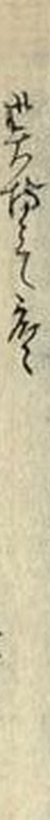御矢場ニて度々
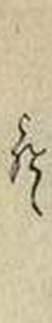被遊候
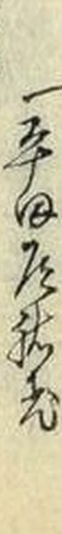平田道祐老

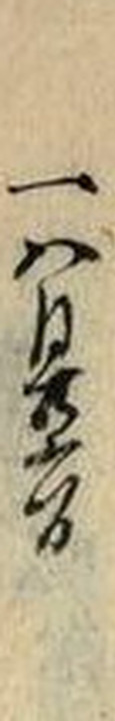一八月廿七日
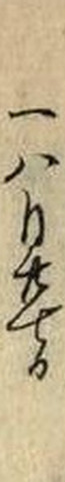一八月廿七日
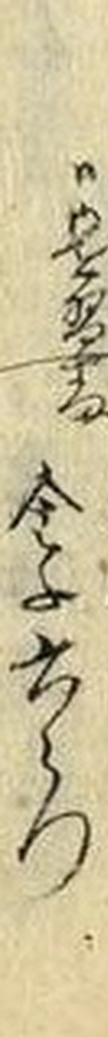同御近習番金子六右衛門
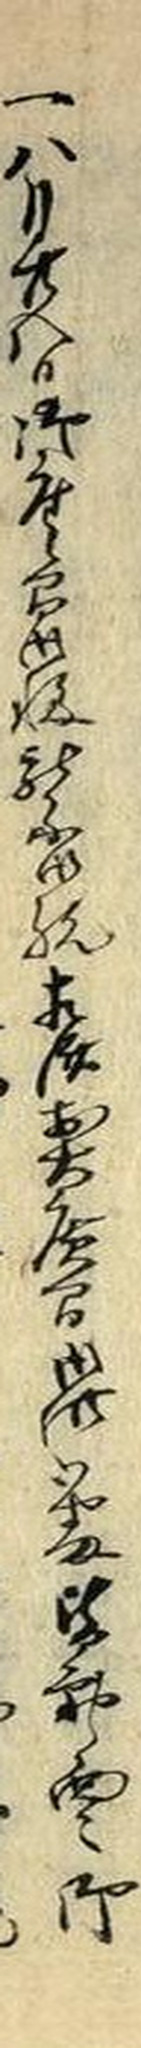一八月廿八日御座之間御移新米御祝相済於大広間御供御番皆勤之面々御
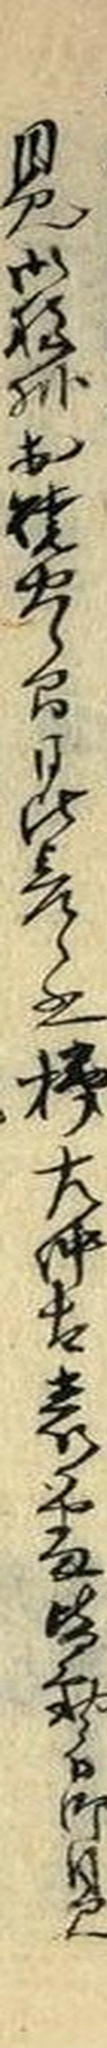目見御移掛於焼火之間日比彦之丞梯左仲太表御番皆勤ニ付御目見
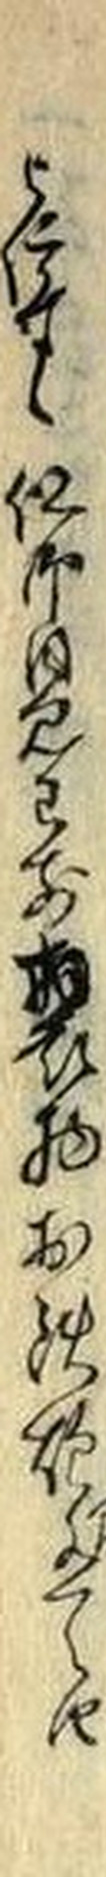被仰付候但御目見已前拝領物於鉄炮之間有之由
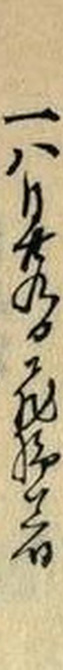一八月廿九日飛脚着
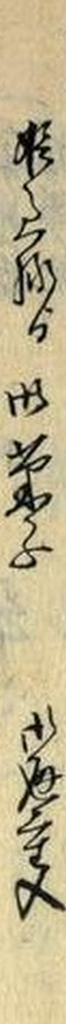姫君様ゟ御菓子御返重入
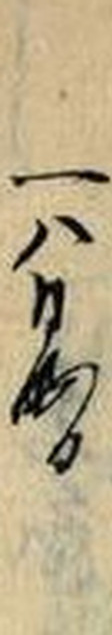一八月晦日
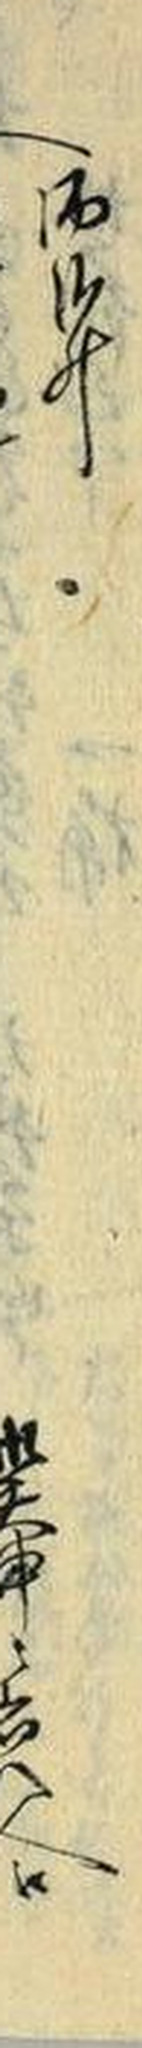豆ふ弐丁御矢申之者八人江
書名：少傅日録抄（斉承付側向頭取日記、在国）
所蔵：福井県文書館 Fukui Prefectural Archives
